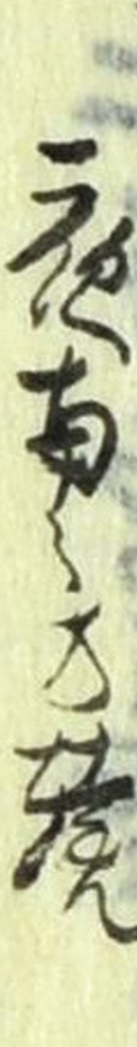夜南之方焼

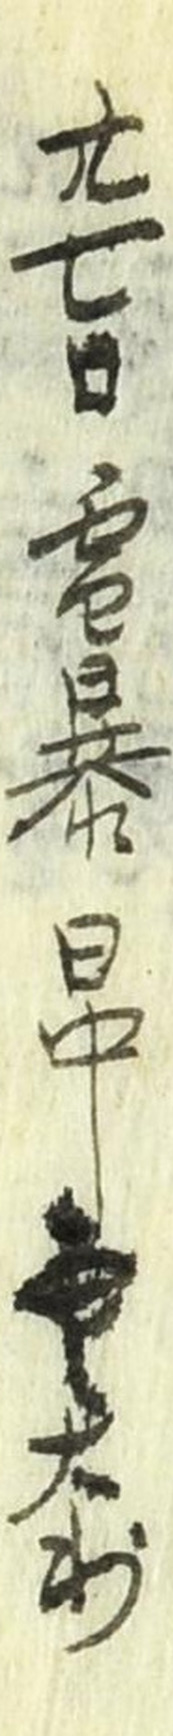廿七日雪暴日中寒大氷
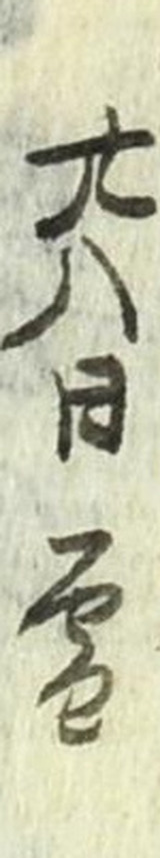廿八日雪
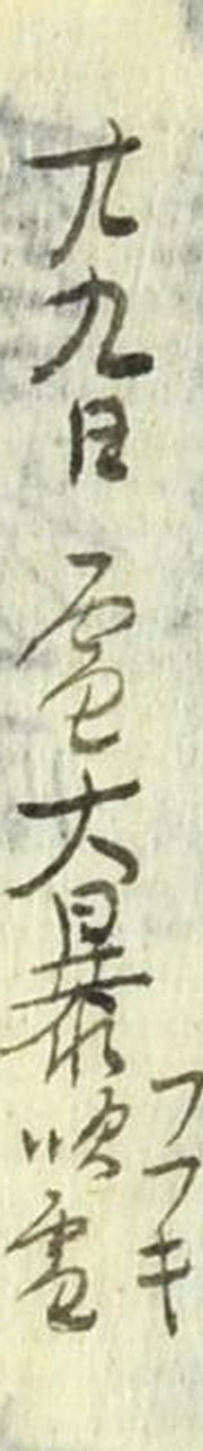廿九日雪大暴吹雪
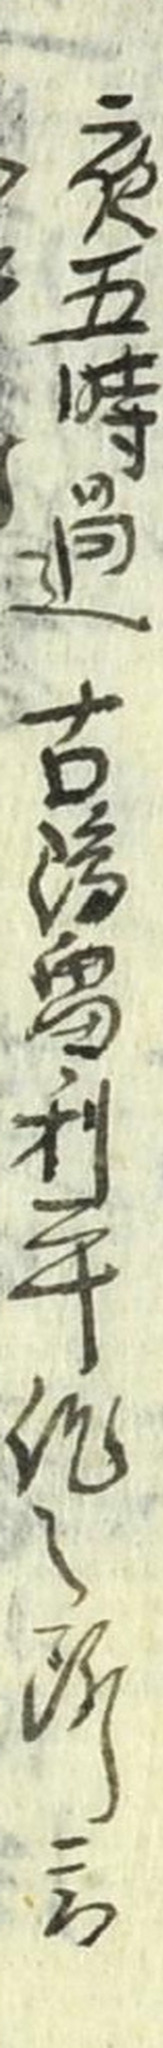夜五時過古島畠利平作之所ニ而
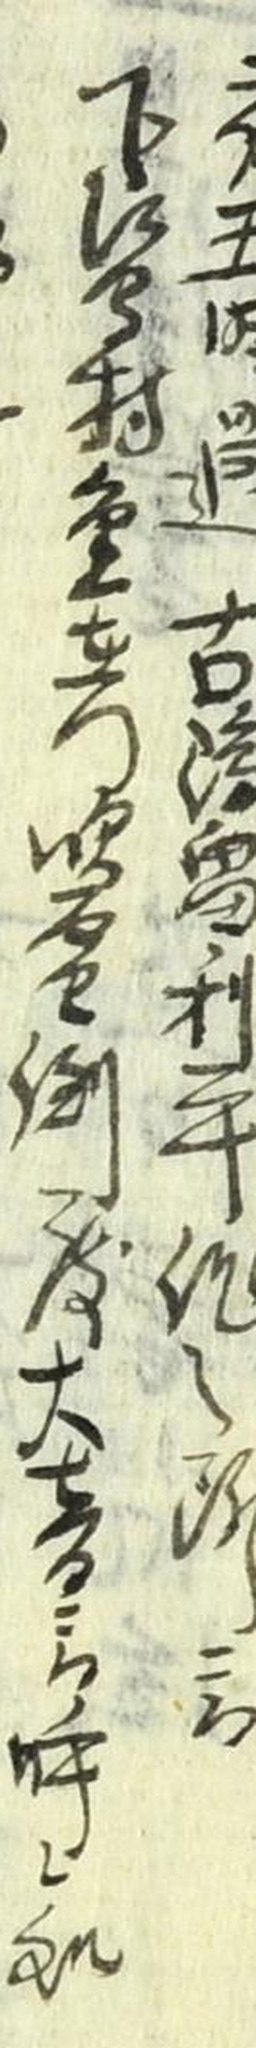下江守村金在門吹雪倒致大音ニ而呼候処
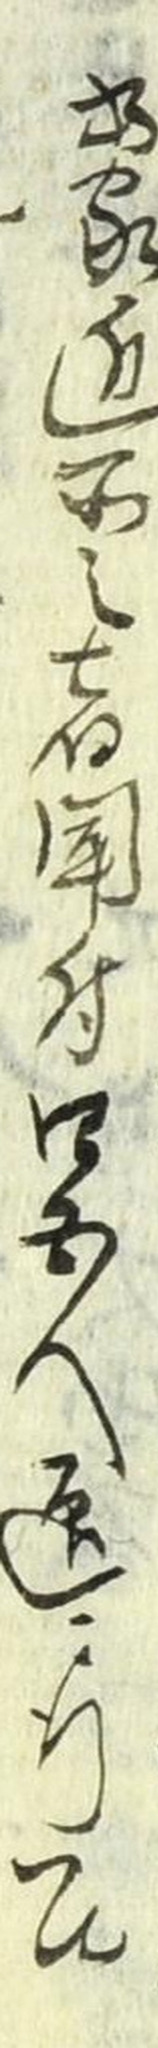当家近所之者聞付四五人迎ニ行召
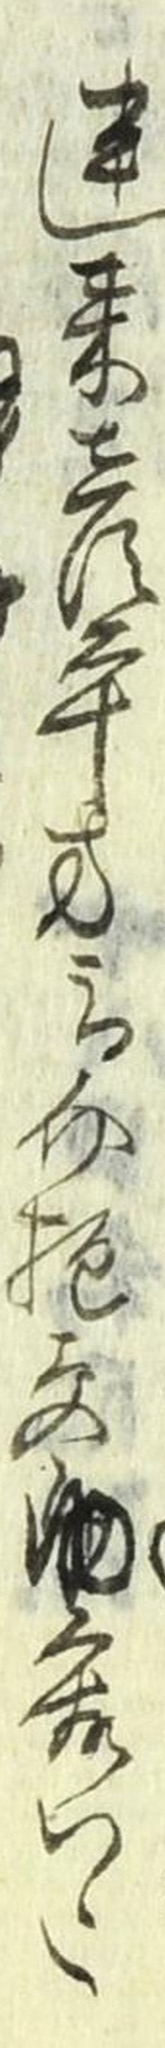連来彦平方ニ而介抱受助命いた
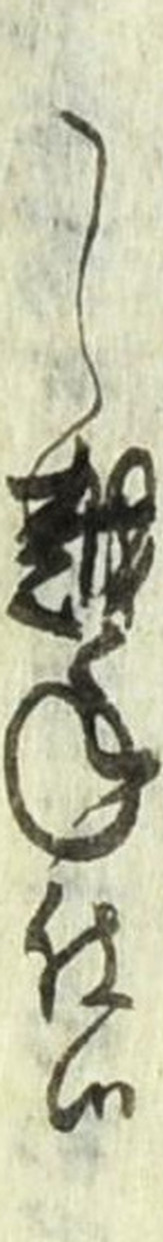し越年仕候
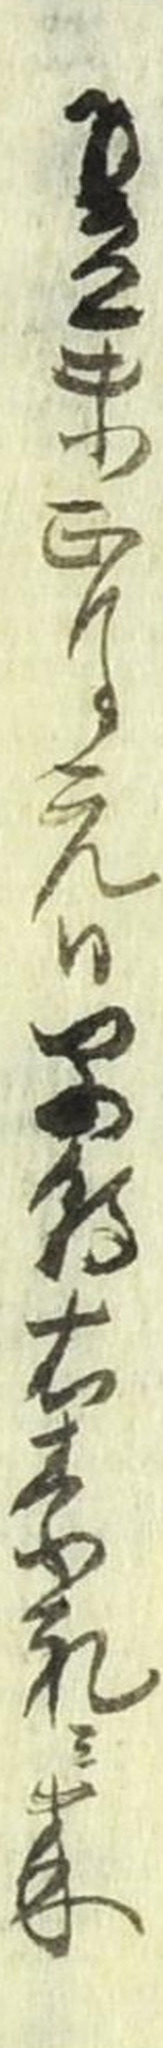翌未正月元日早朝右素礼シ来

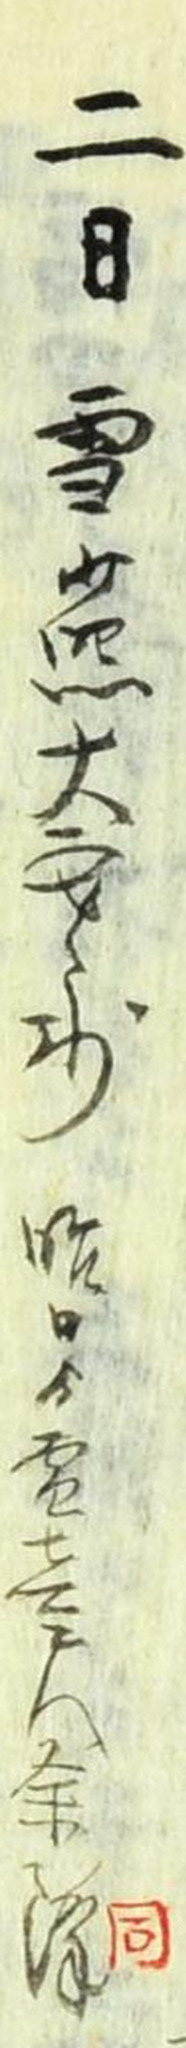二日雪少照大寒氷昨日ゟ雪壱尺余降「同」
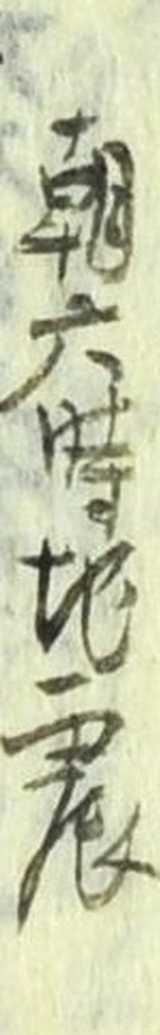朝六時地震
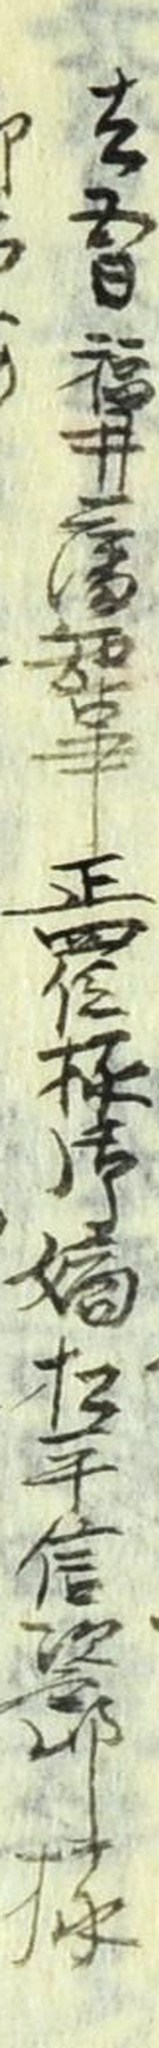去五日福井藩知事正四位様嫡松平信次郎様
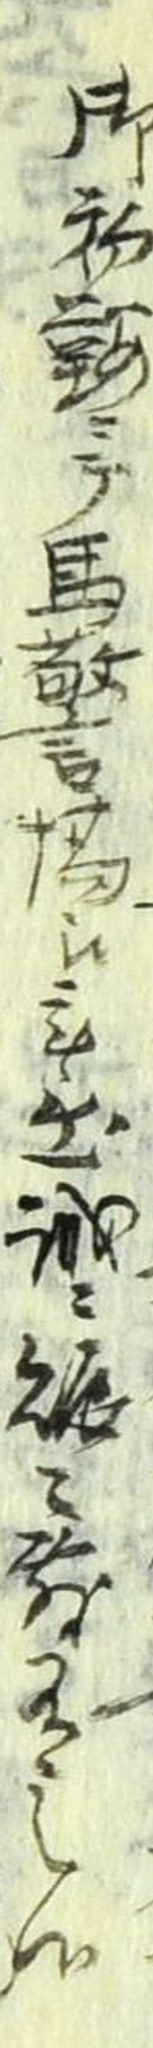御初鞍ニテ馬警場江被出誠ニ賑々敷有之候
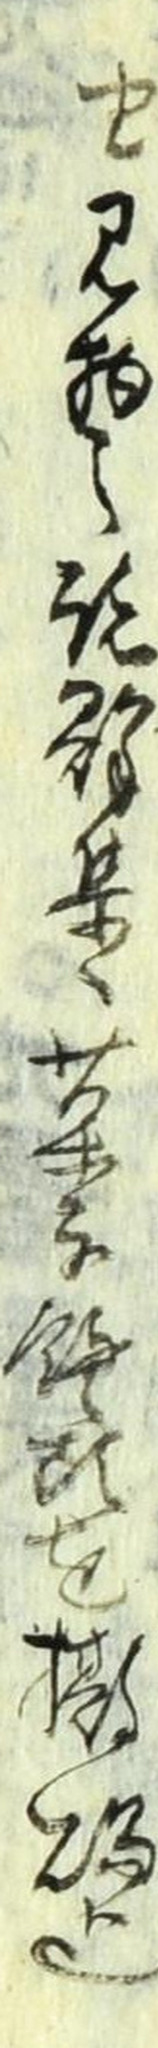由見物之諸群集へ菓子饅頭を撒賜迄
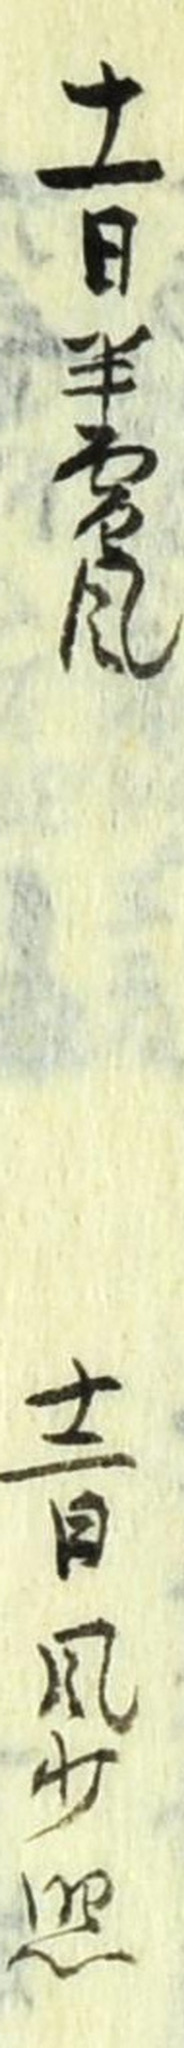十一日半雪風十二日風少照
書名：（日記）
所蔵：福井県文書館 Fukui Prefectural Archives
